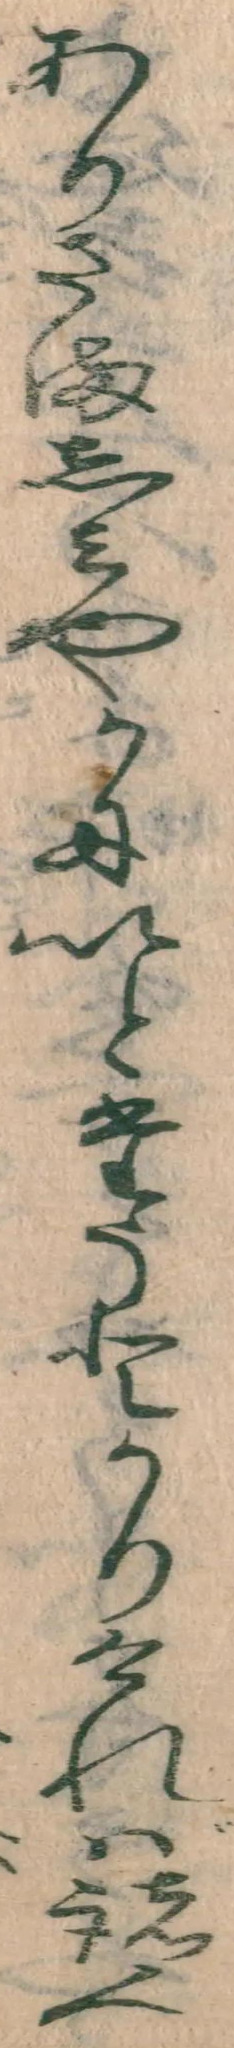ありさましみやかにいとたうとかりけれは諸人
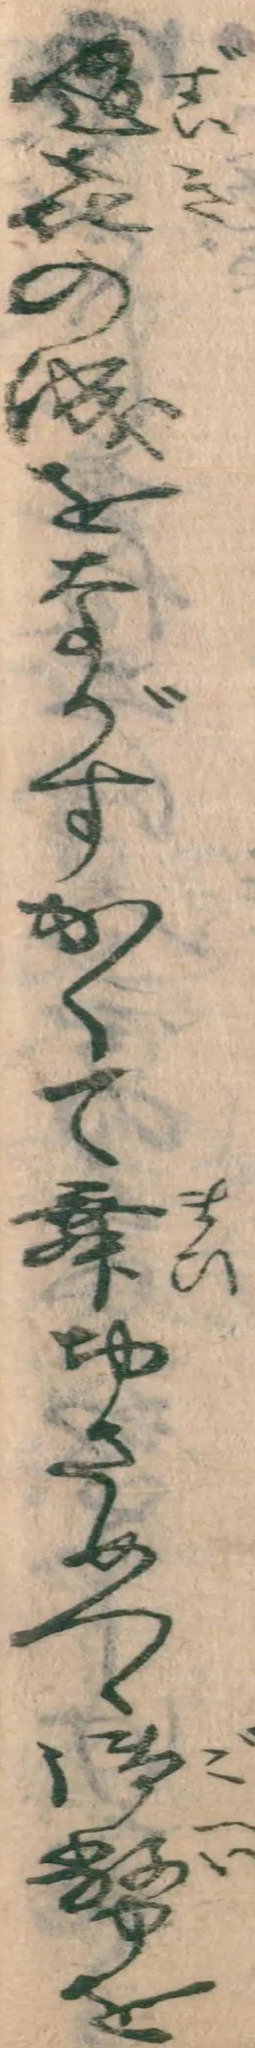随喜の洟をながすかくて舞おさめつゝ御幣を
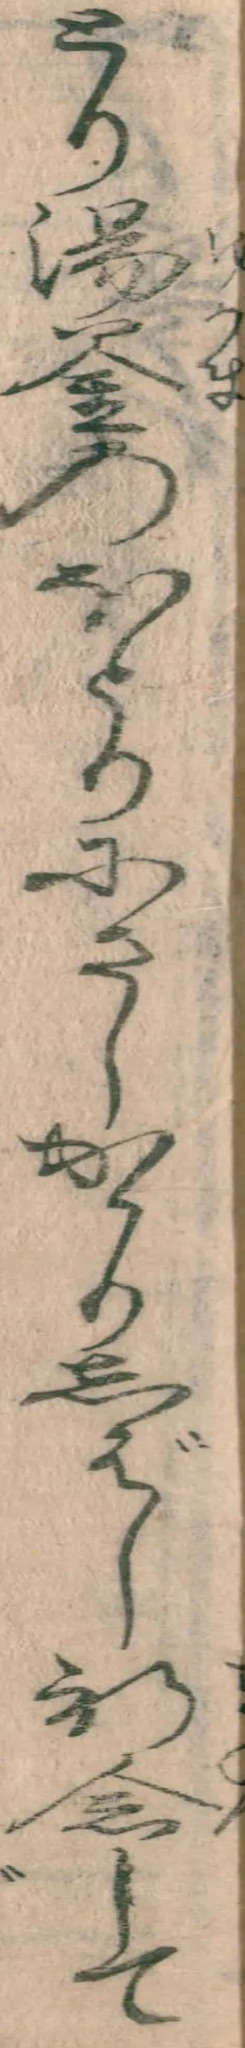とり湯釜のほとりにさしかゝりしばし祈念して
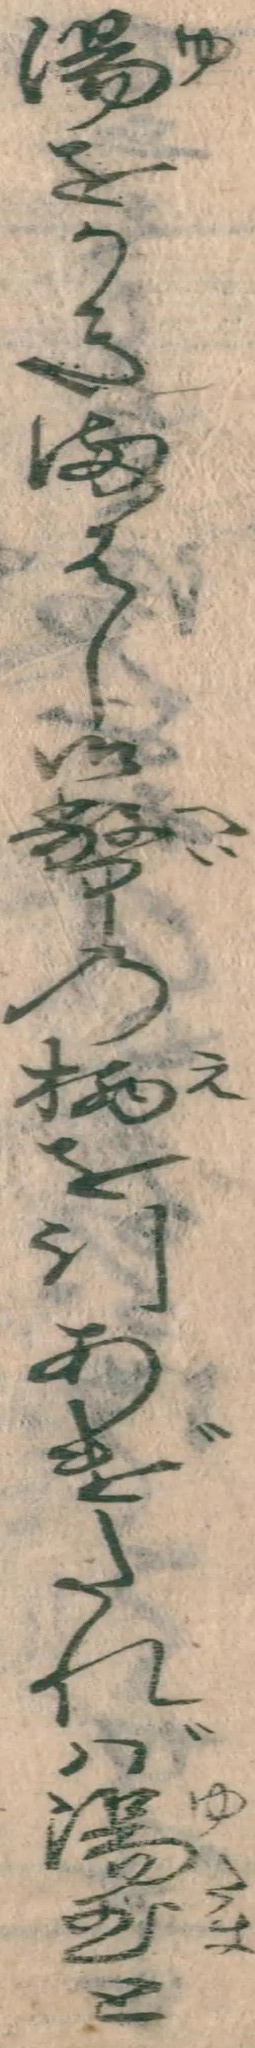湯をかきまはし御幣の柄を引あげたれば湯玉と
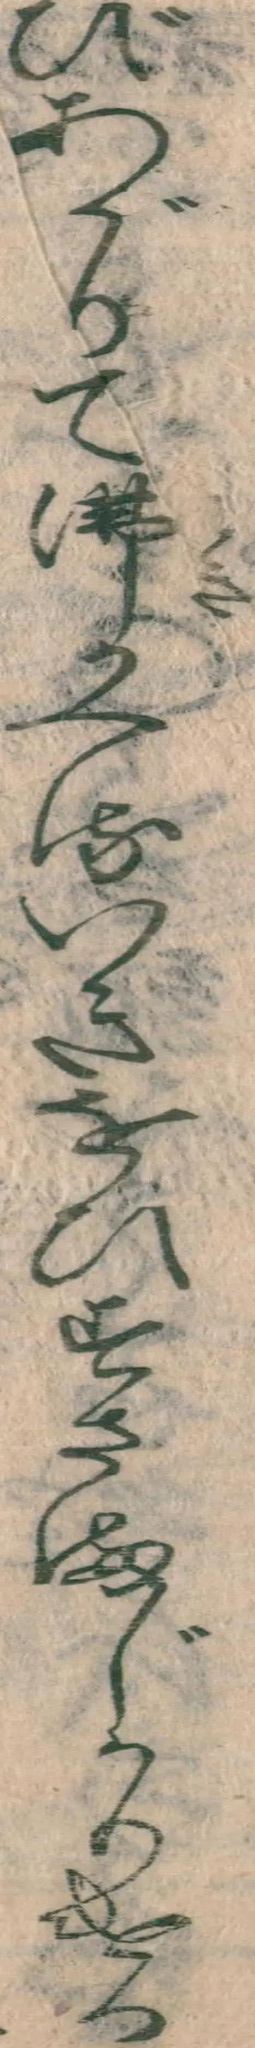びあがりて沸かへるいきをひすさまじかりける
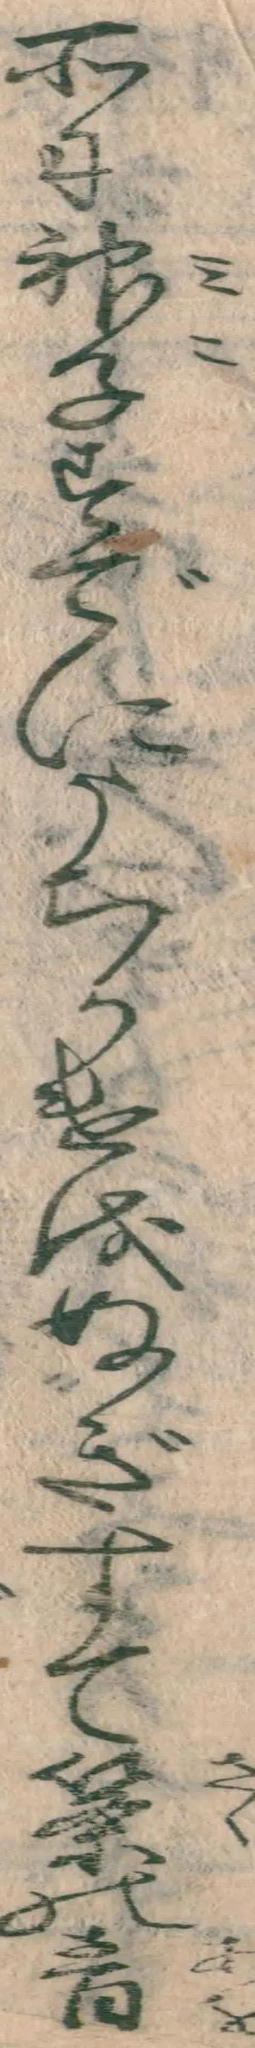所に神子すでにうちかけをぬぎすて策の青
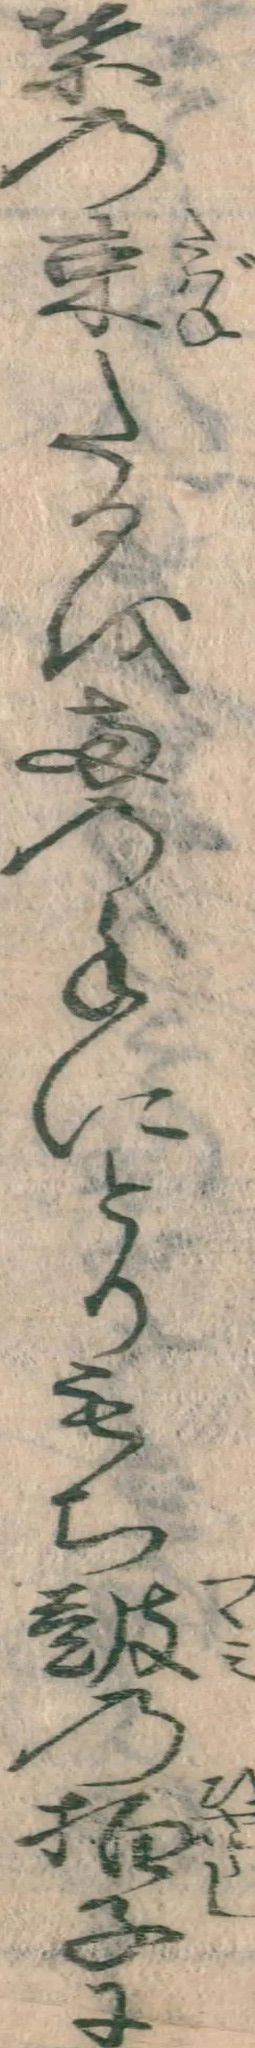柴の束たるを両の手にとりもち鼓の拍子に
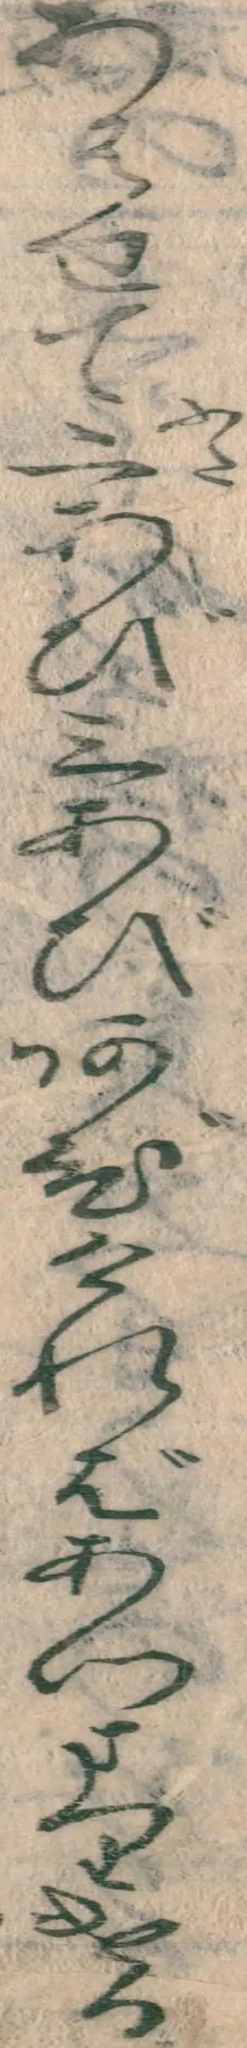あはせてニあび三あびあびければあつまりける
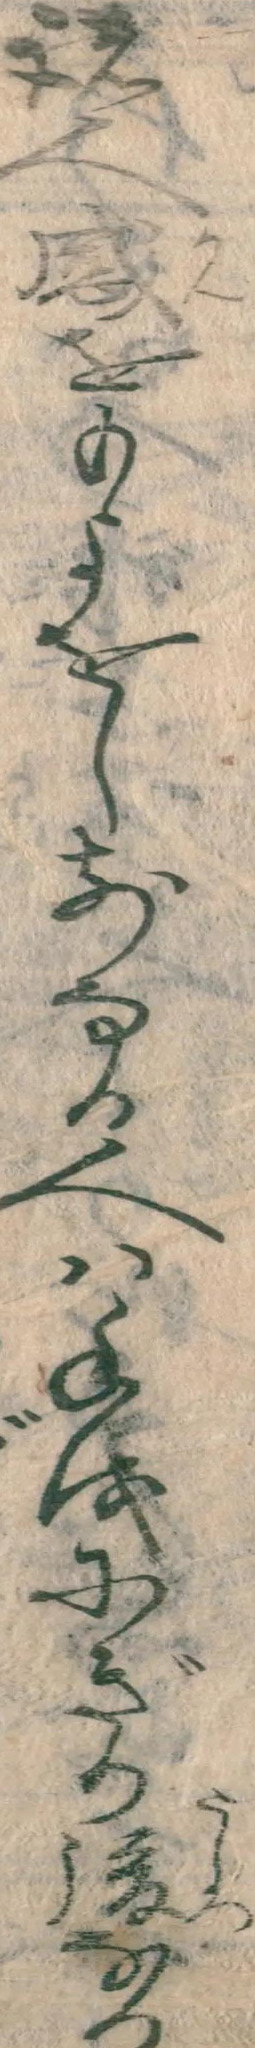諸人感をもよをし前なる人は手をにぎり後なる
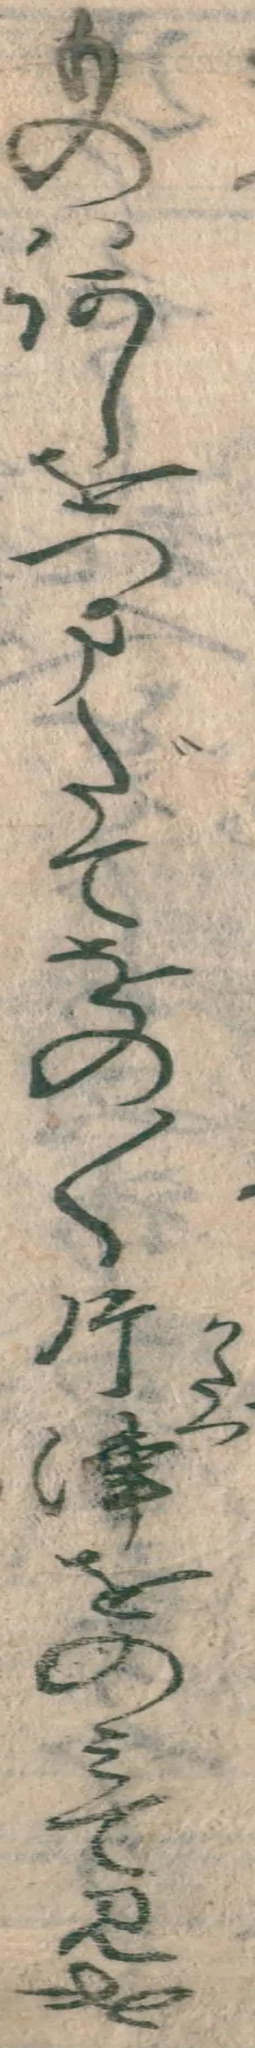ものはあしをつまだてをの〳〵片津をのみて見け
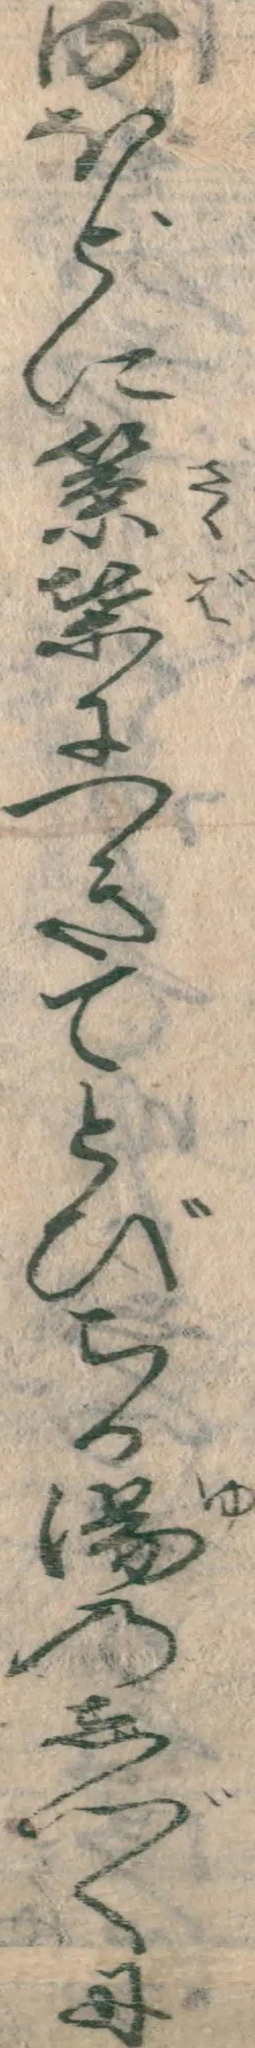るほどに策柴につきてとびちる湯のしづくに
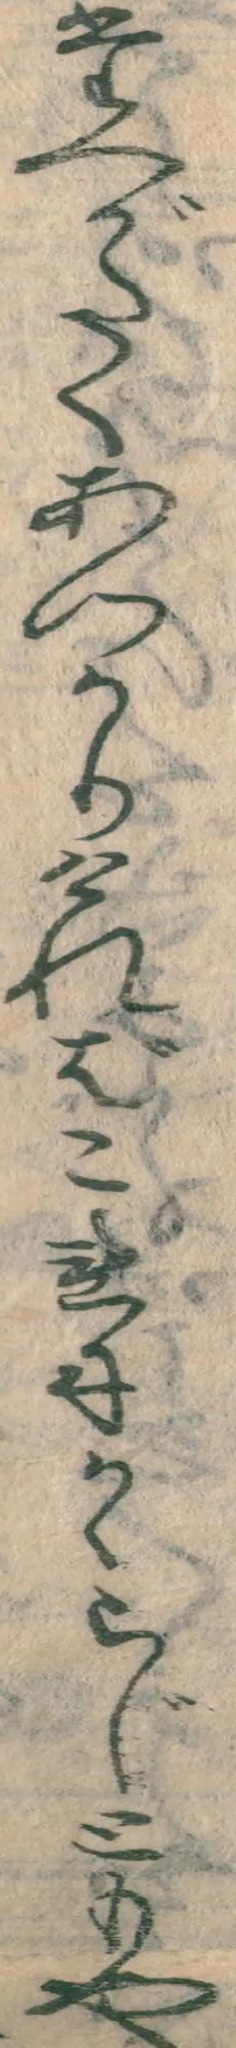たへがたくあつかりければこれにかゝらじともや
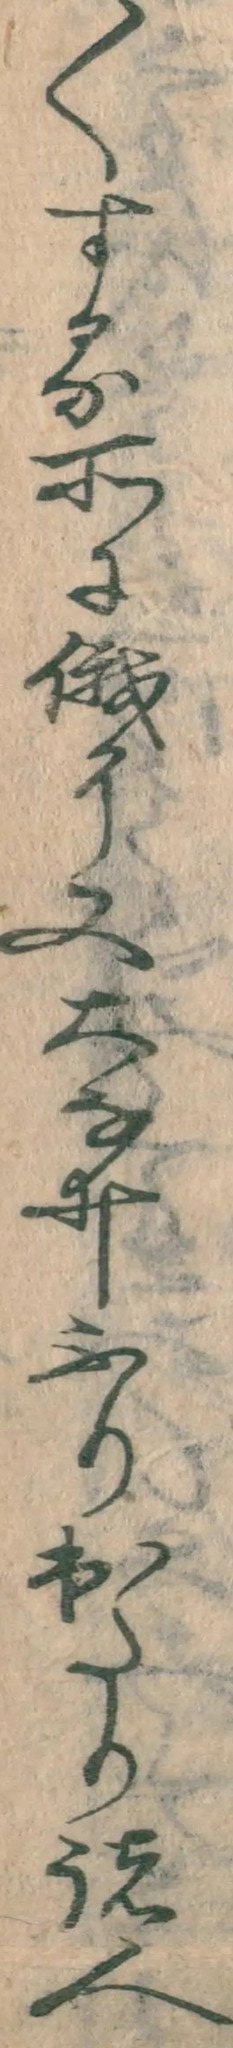〳〵する所に俄に又大なゐふり出たり諸人

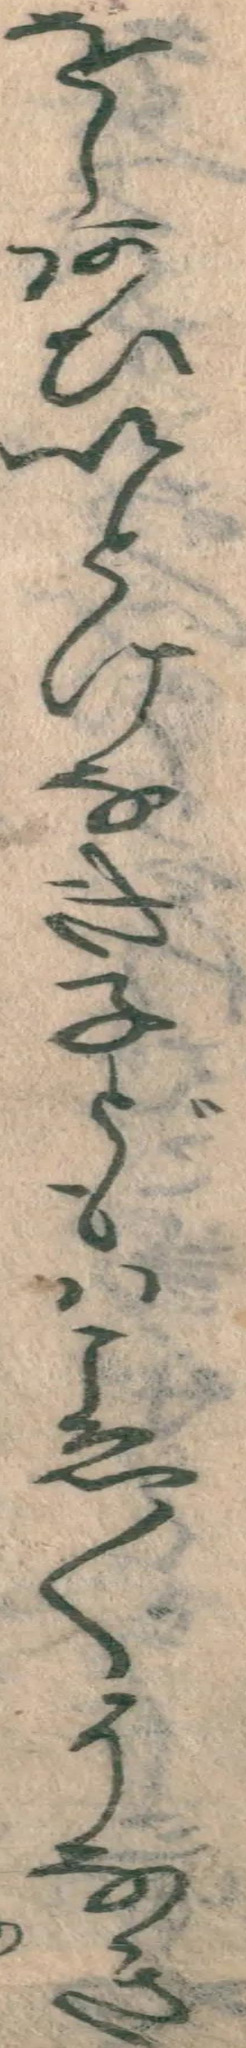をしあひいとけなき子どもはこゑ〳〵になき
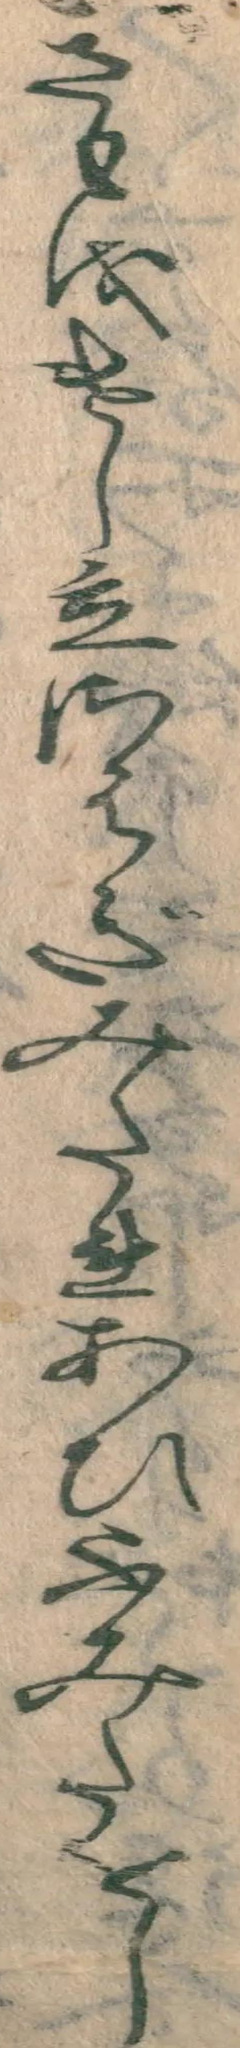きもをけし立さはぎみたれあひふみたをし
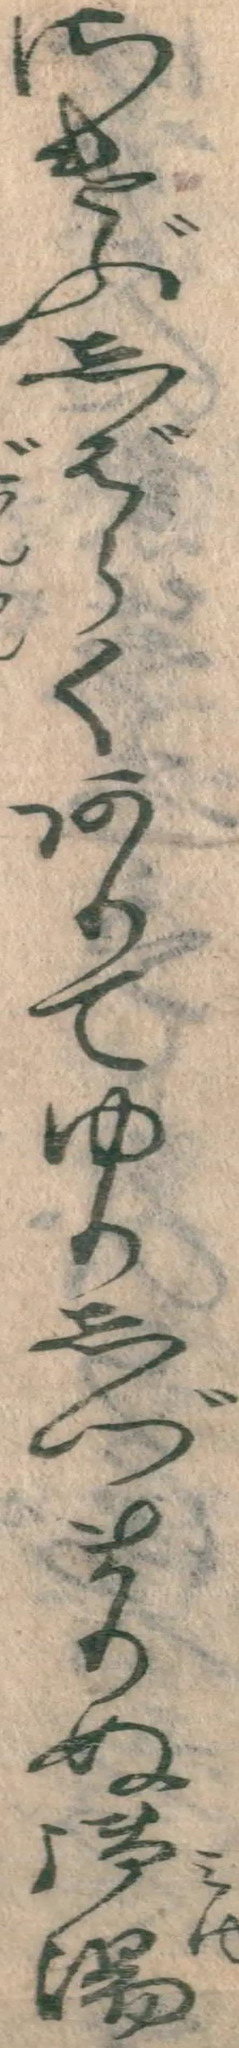さけぶしばらくありてゆりしづまりぬ御湯
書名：艱難目異志. 上,下
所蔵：国立国会図書館 National Diet Library, JAPAN
